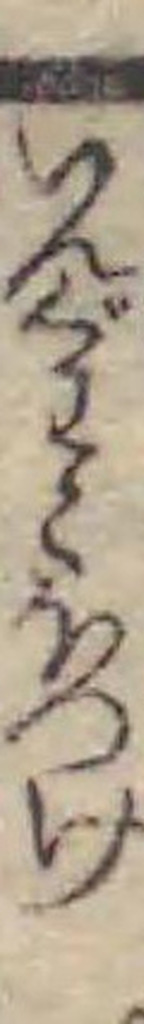いんぐわとほつけ
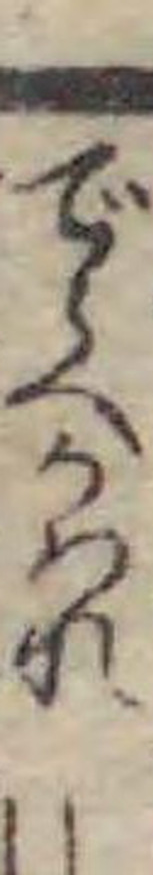でらへかはれ
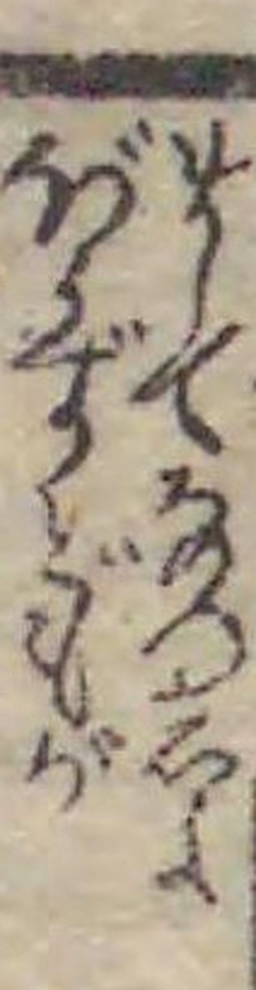ぼうずどもが
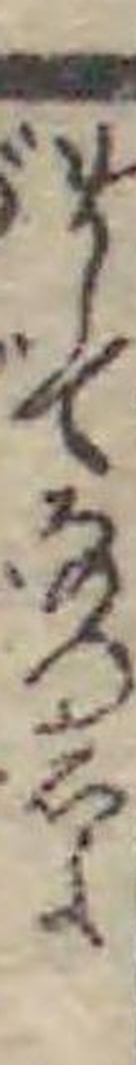ましてなつしよ
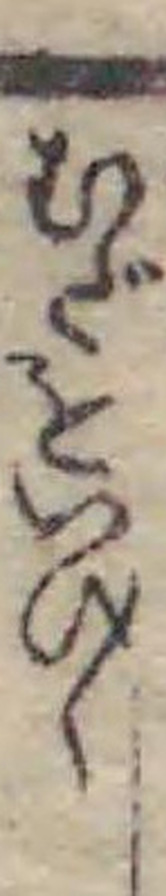むだをいひ〳〵
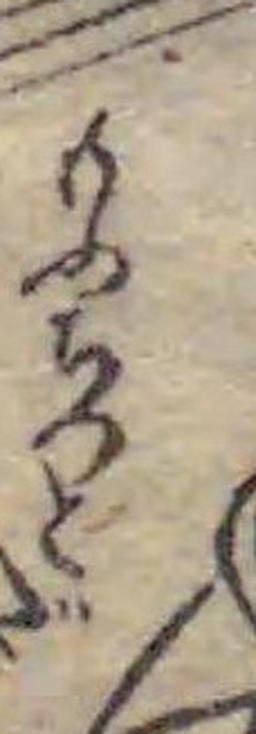もふちつとだ
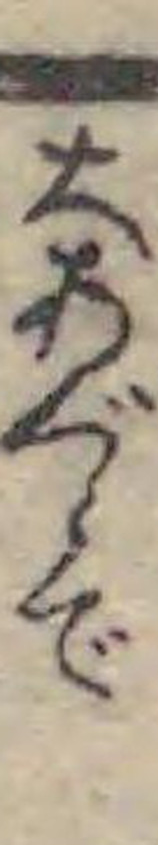大あぐらで
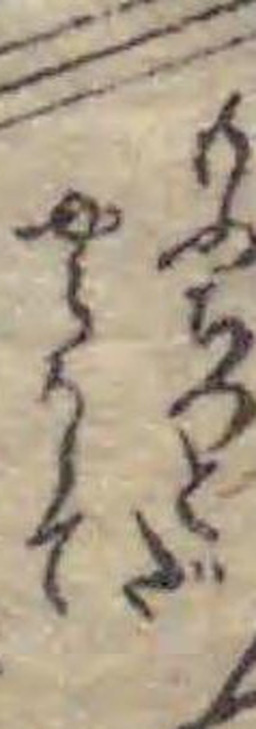やらかして
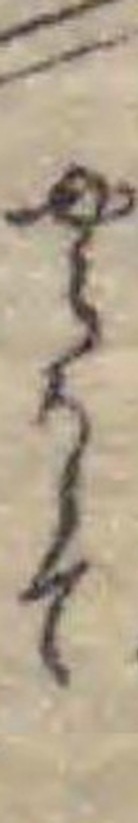やらかして
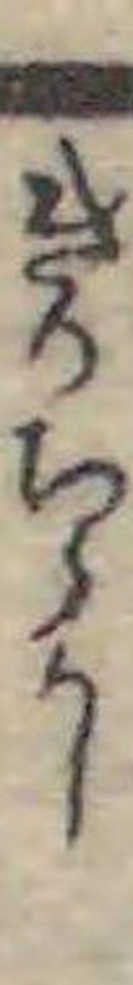きりちらかし
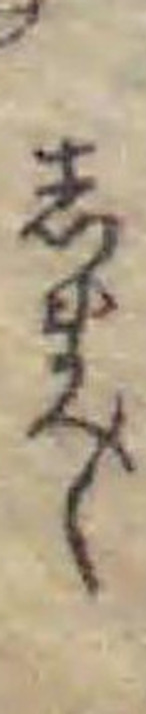しまへ〳〵
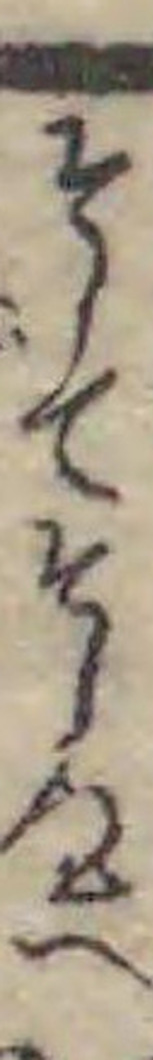そしてそし様へ
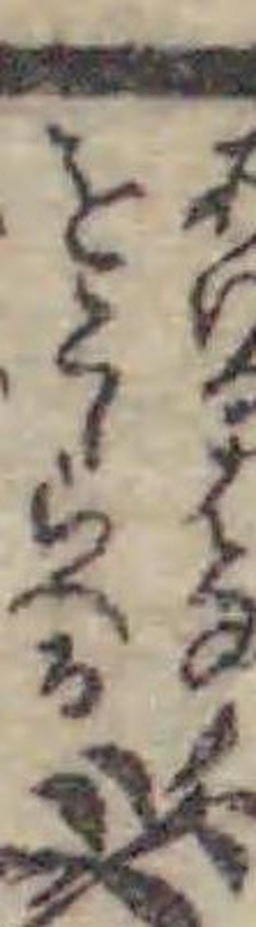をこしらへる
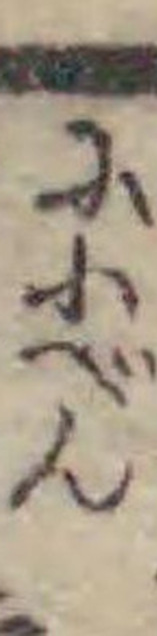に小べん
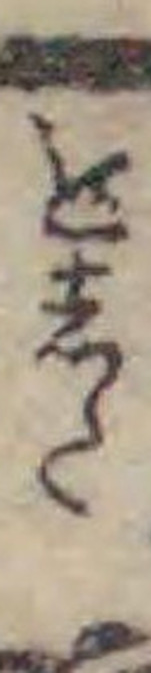をした
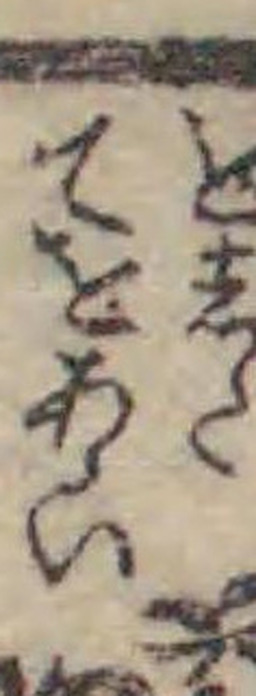てをあらい
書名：紙屑身上噺 : 3巻
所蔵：国立国会図書館 National Diet Library, JAPAN
